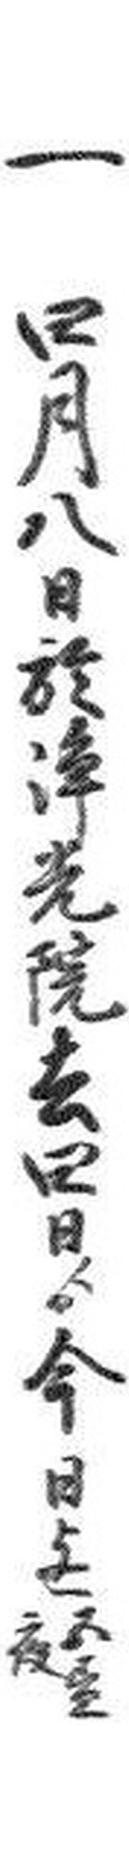一四月八日於浄光院去四日ゟ今日迄五昼夜
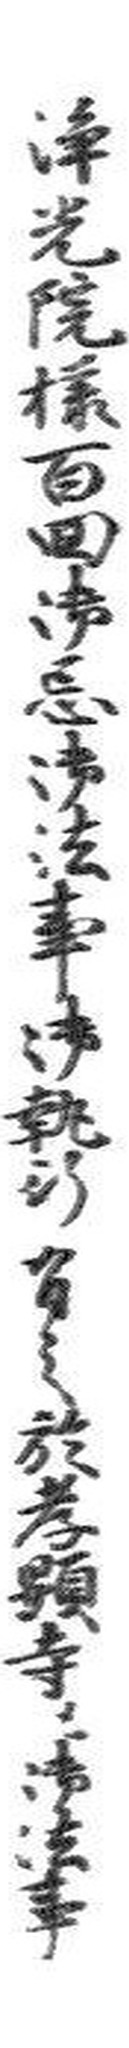浄光院様百回御忌御法事御執行有之於孝顕寺も御法事
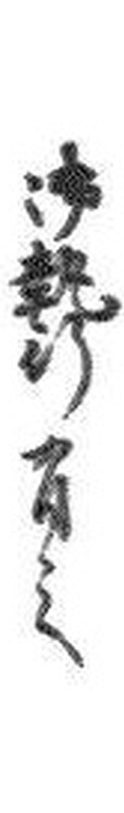御執行有之
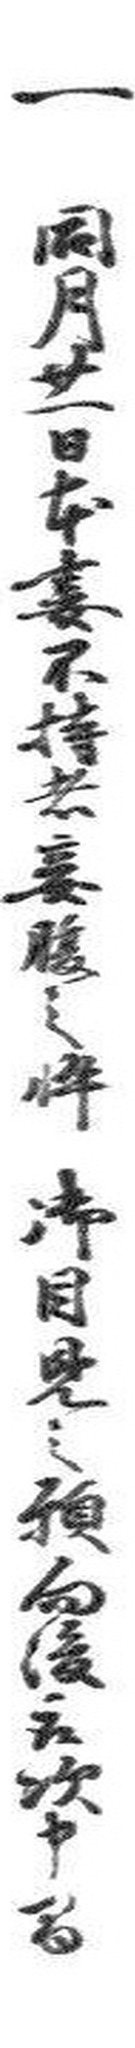一同月廿一日本妻不持者妾腹之倅御目見之願向後取次申間
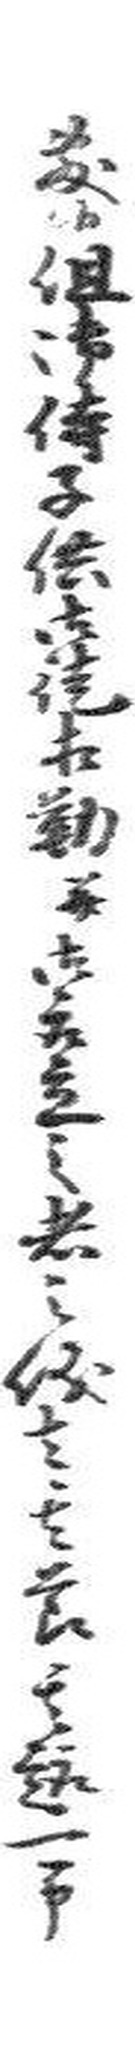敷候組御侍子供御徒相勤并御取立之者之儀者其節其趣可申
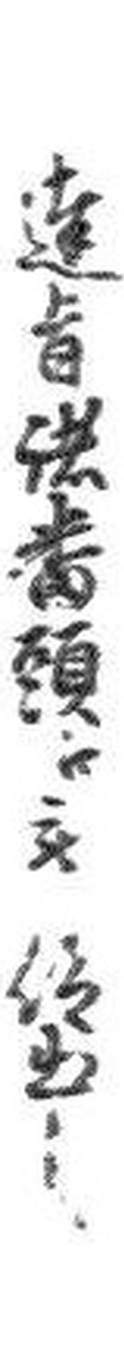達旨諸番頭江被仰出之
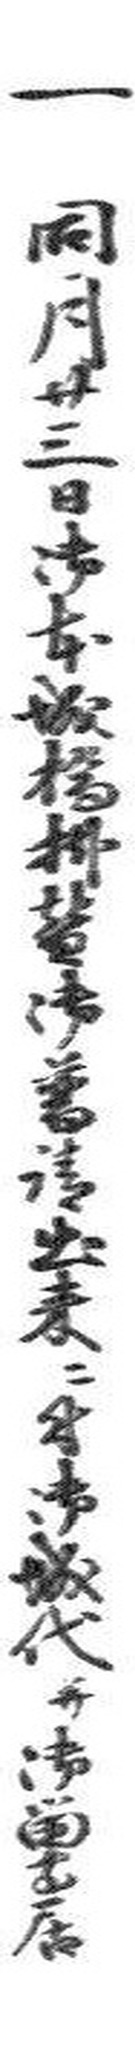一同月廿三日御本城橋掛替御普請出来ニ付御城代并御留守居

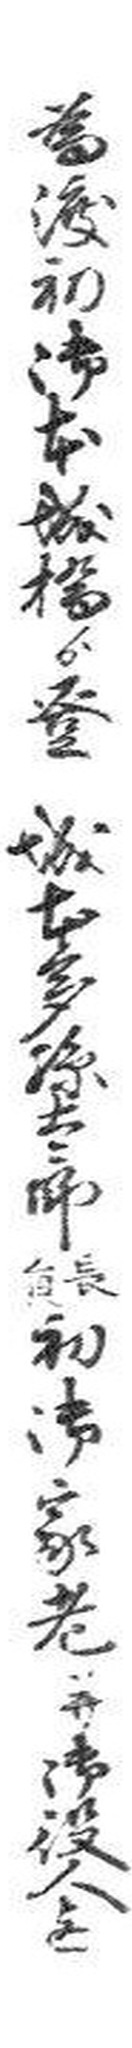為渡初御本城橋ゟ登城本多孫太郎長員初御家老并御役人迄
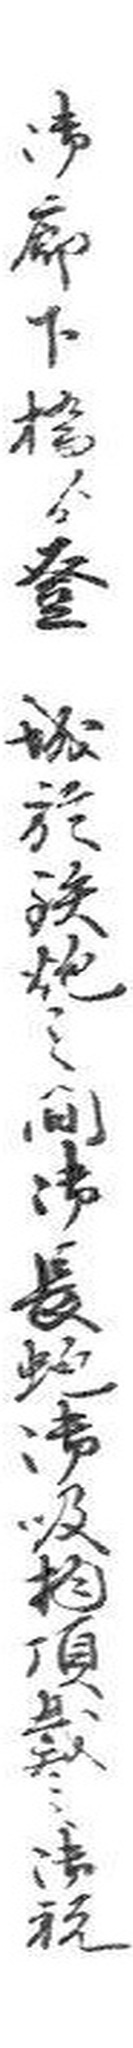御廊下橋ゟ登城於鉄砲之間御長蚫御吸物頂戴之御祝
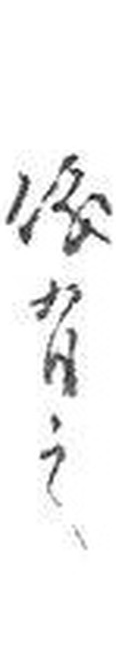儀有之
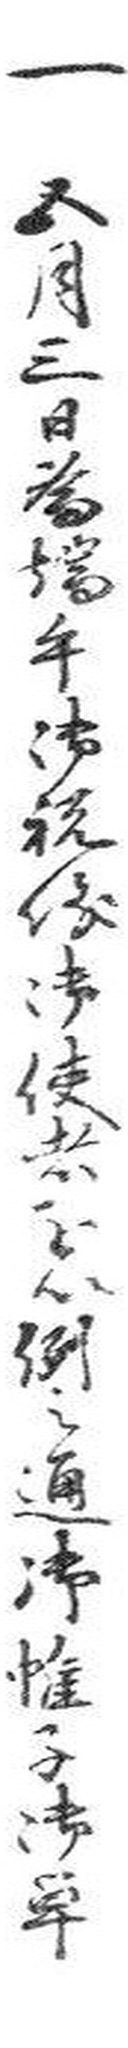一五月三日為端午御祝儀御使者を以例之通御帷子御単
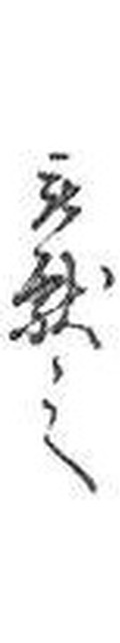被献之
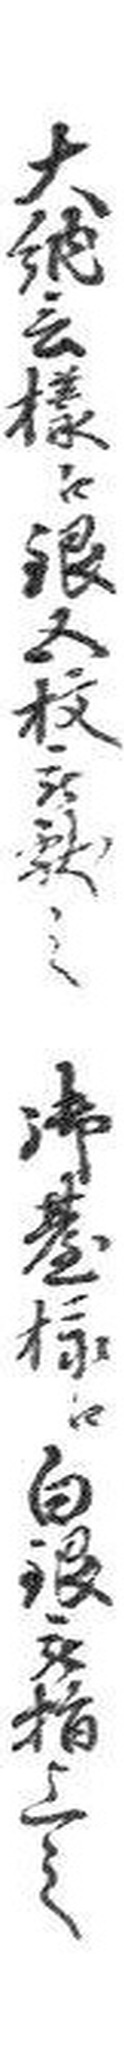大納言様江銀五枚被献之御台様江白銀被指上之
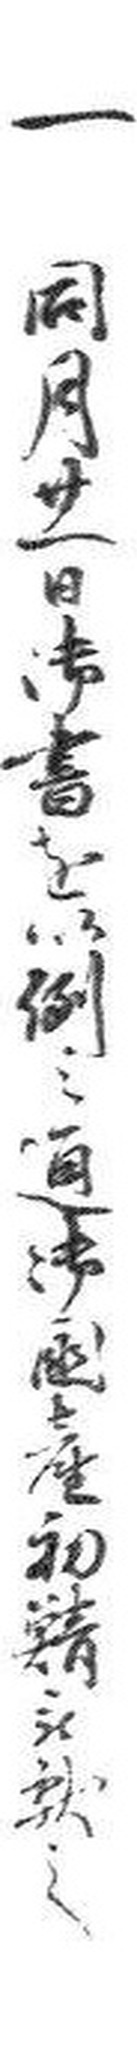一同月二十一日御書を以例之通御国産初鯖被献之
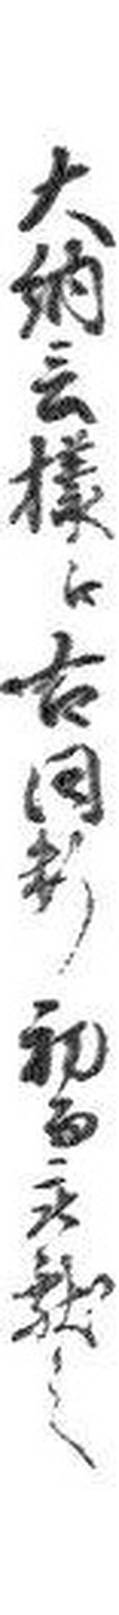大納言様江右同断初而被献之
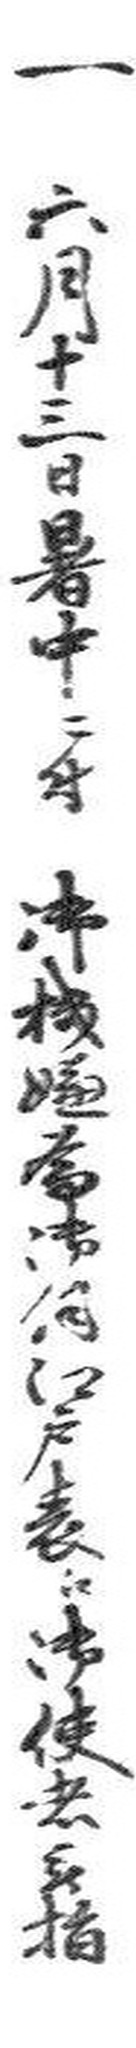一六月十三日暑中ニ付御機嫌為御伺江戸表江御使者被指
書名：家譜 二十四 吉品公 従宝永三年到同五年
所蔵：福井県文書館 Fukui Prefectural Archives
